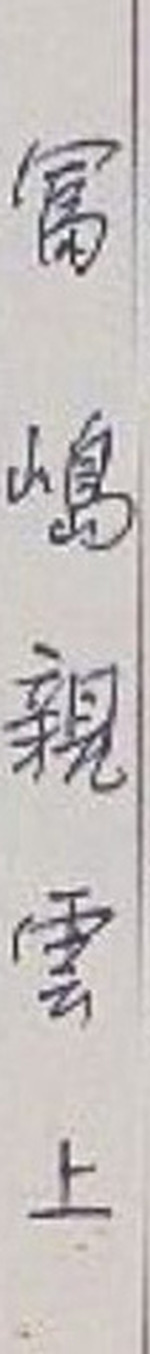冨島親雲上
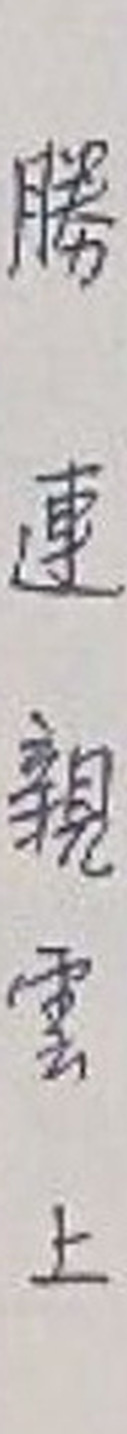勝連親雲上
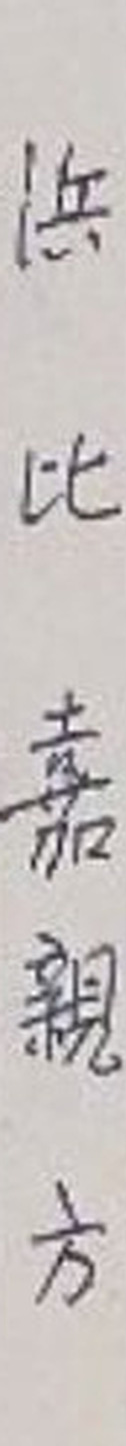浜比嘉親方
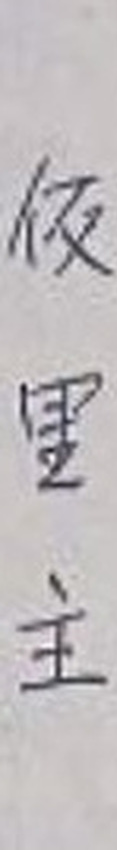仮里主
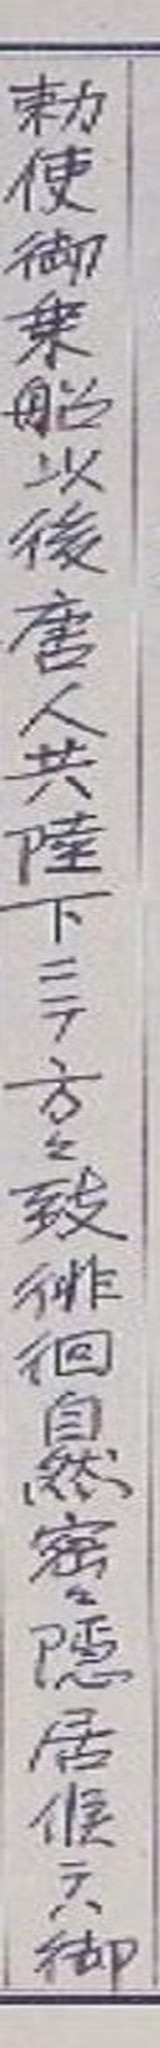勅使御乗船以後唐人共陸下にて方々致徘徊自然密々隠居候ては御
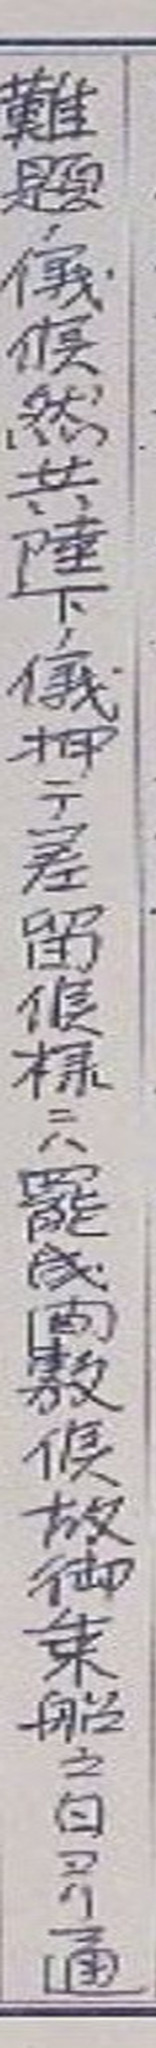難題の儀候然共陸下の儀押て差留候様には罷成間敷候故御乗船之日より通
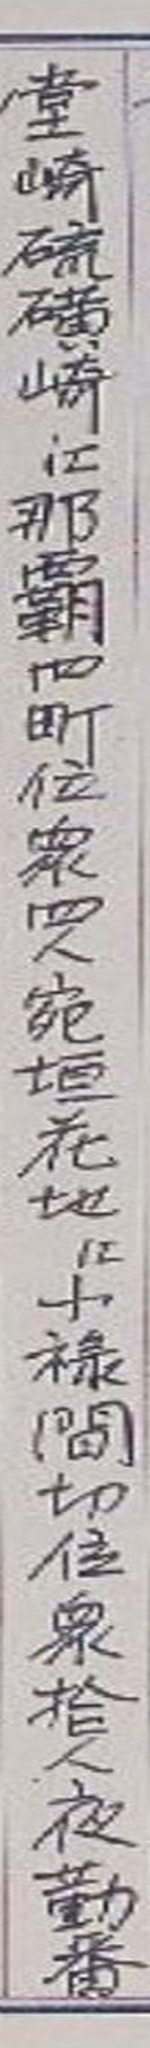堂崎硫磺崎え那覇四町位衆四人宛垣花地え小禄間切位衆拾人夜勤番

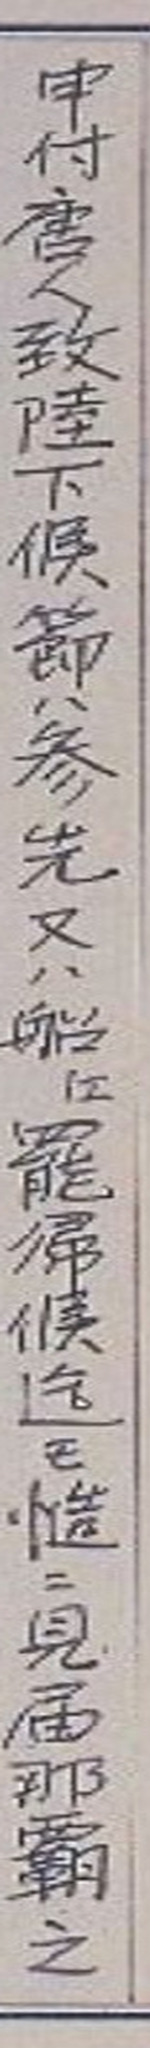申付唐人致陸下候節は参先又は船え罷帰候迄も慥に見届那覇之
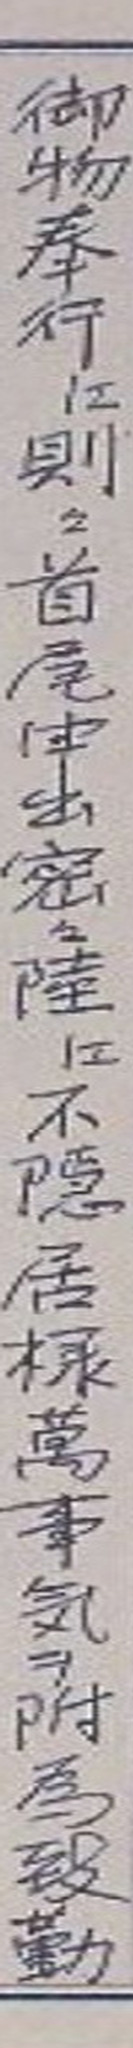御物奉行え則々首尾申出密々陸え不隠居様万事気を附為致勤
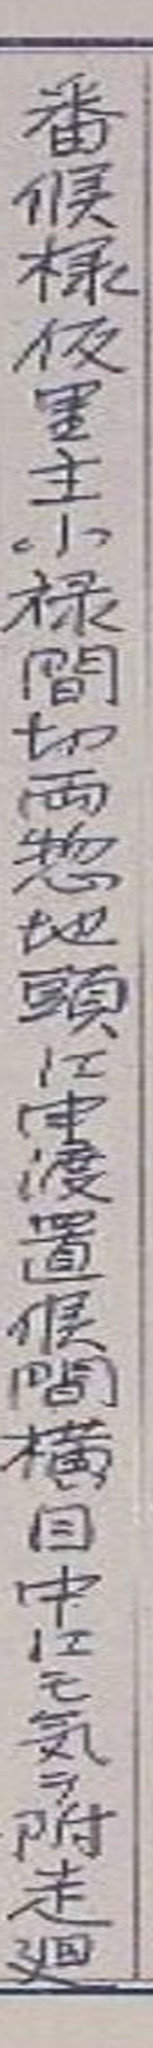番候様仮里主小禄間切両惣地頭え申渡置候間横目中えも気を附走廻
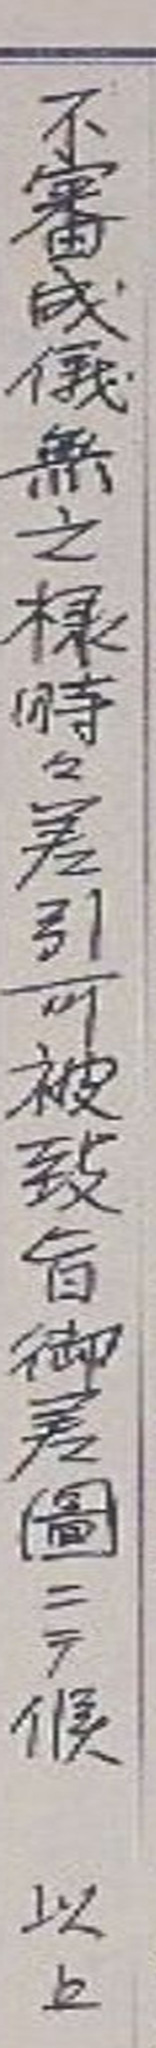不審成儀無之様時々差引可被致旨御差図にて候以上
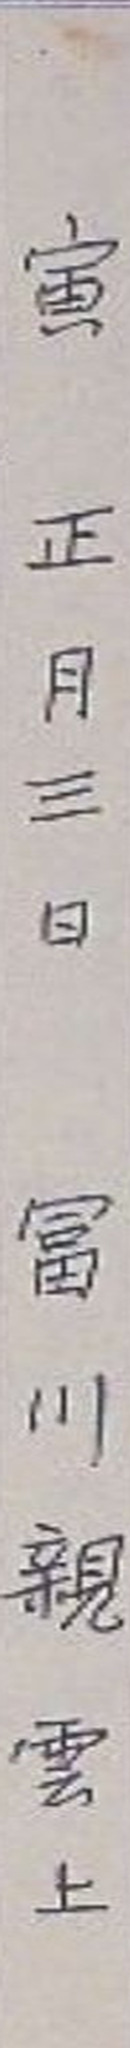寅正月三日冨川親雲上
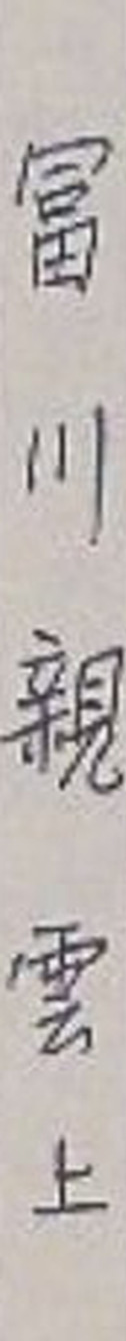冨島親雲上
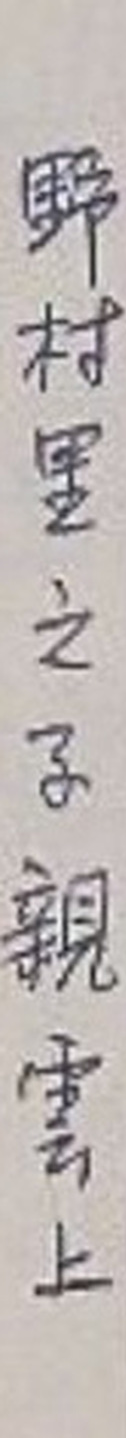野村里之子親雲上
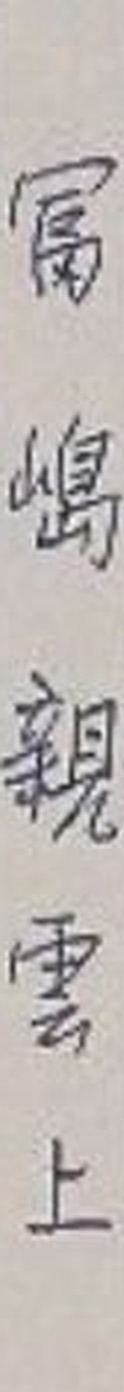冨島親雲上
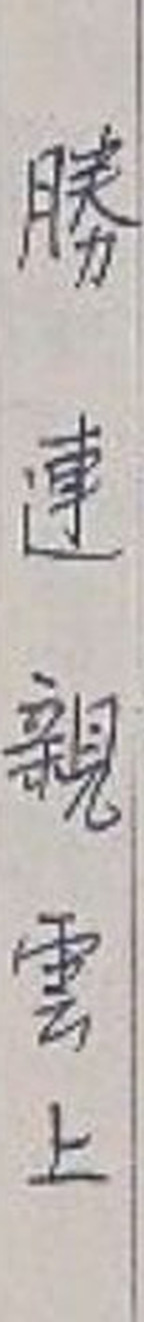勝連親雲上
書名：支那冊封使来琉諸記 下巻
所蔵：University of the Ryukyus Library
